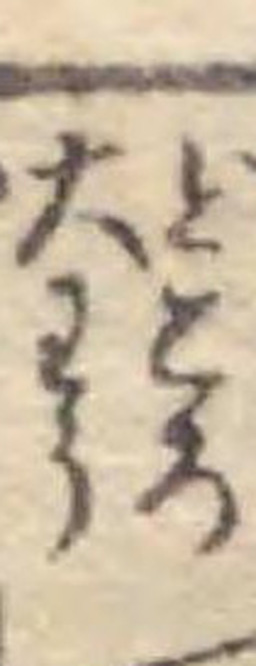大わう
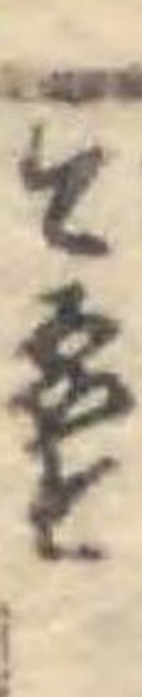てゑそ
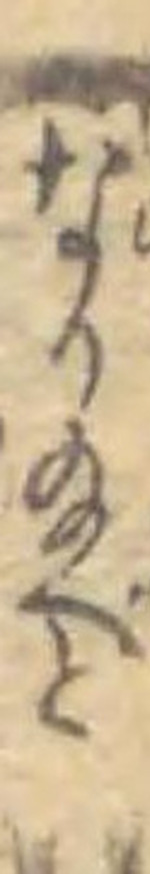なり給へと
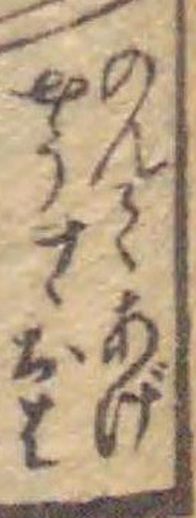のんてあげ
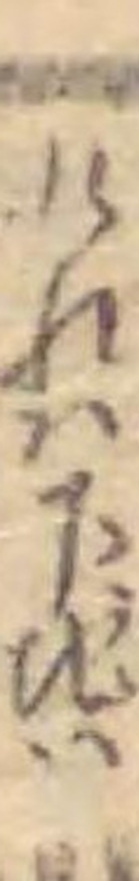けれは下地は
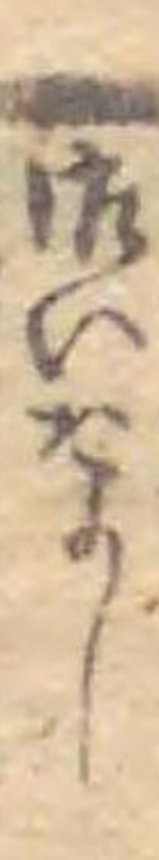御いぞよし
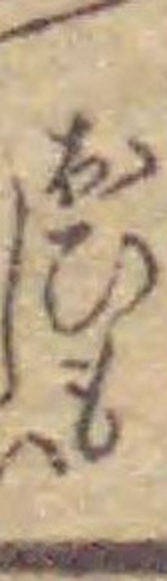おひも
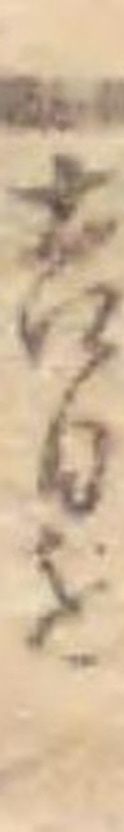吉日を
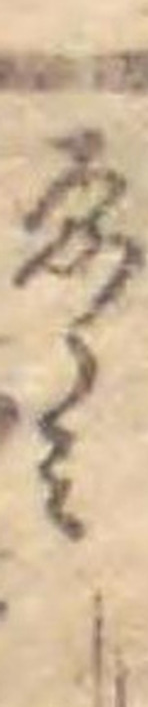ゑらみ
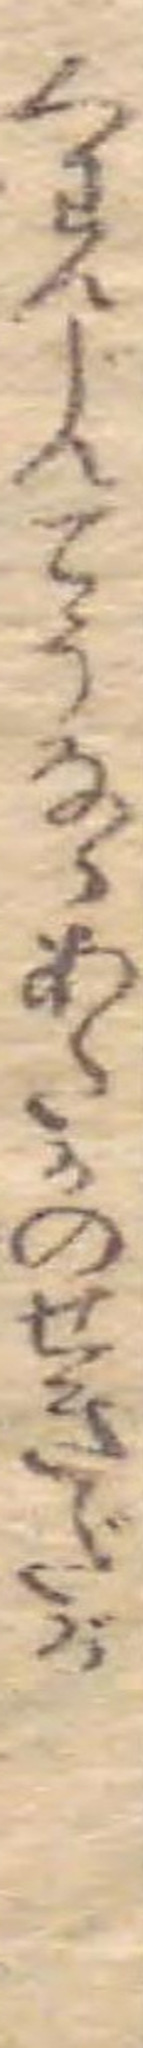くわんじんてうならあたかのせきだが
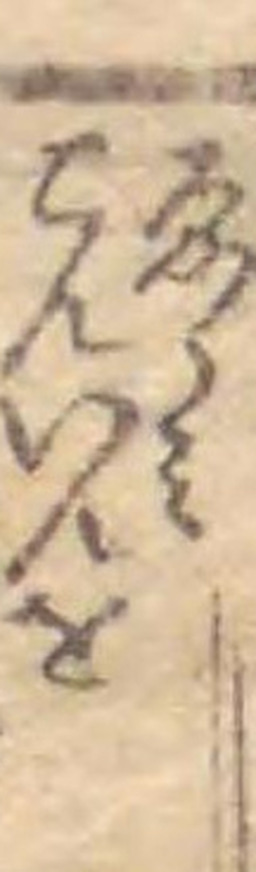こんいんを
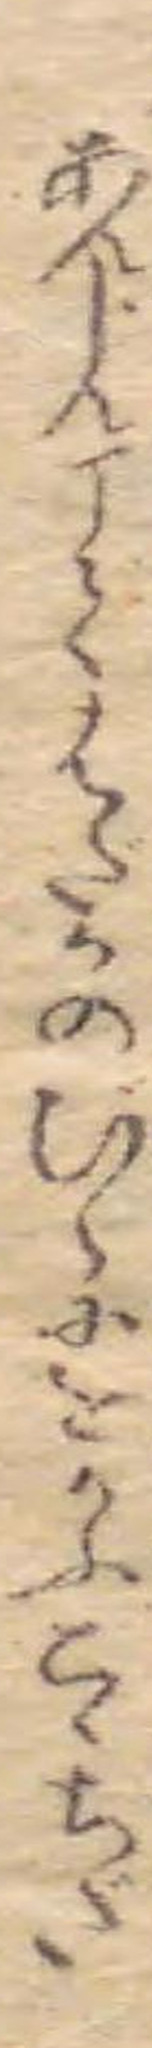あんじん丁てはだかのびくにをかふこゝちだ
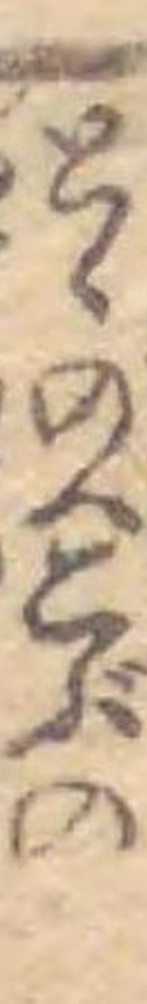とゝのへこぶの
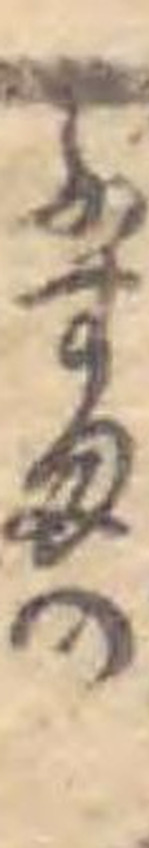ふすまの
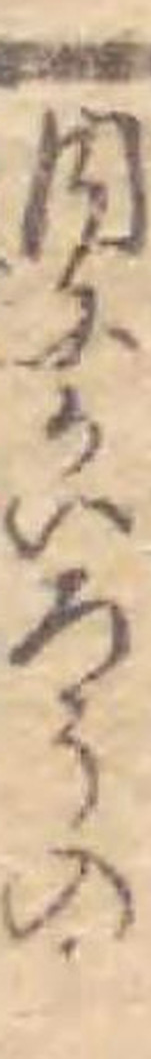内にかいろうの
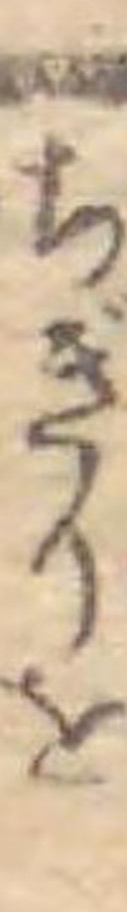ちぎりを
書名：悦贔負蝦夷押領 : 3巻
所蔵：国立国会図書館 National Diet Library, JAPAN
